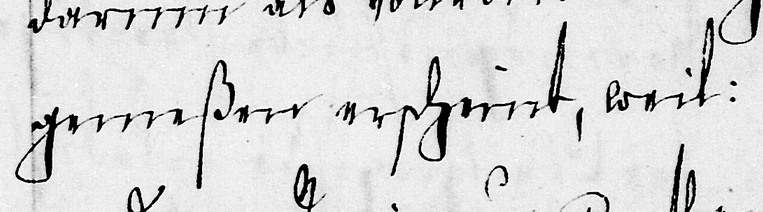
gemeßen erscheint, weil:
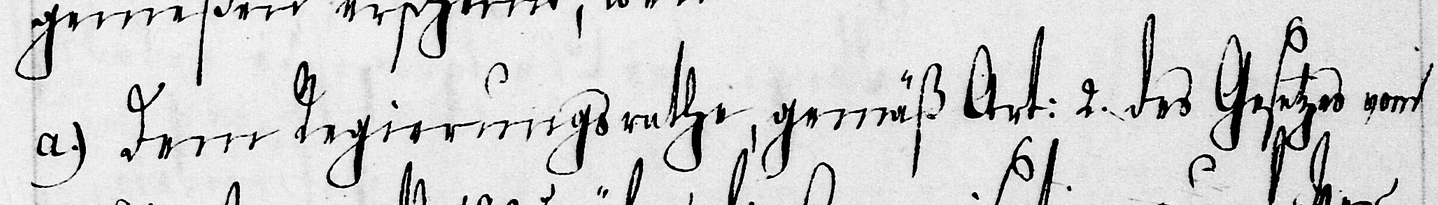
a.) Dem Regierungsrathe, gemäß Art: 2 des Gesetzes vom
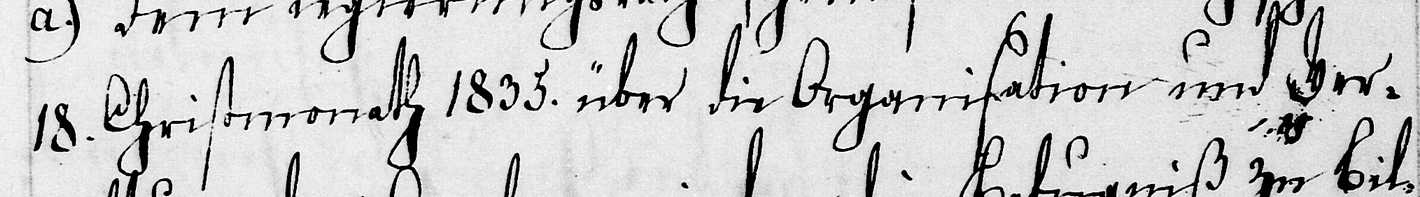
18. Christmonath 1835. über die Organisation und Ver¬
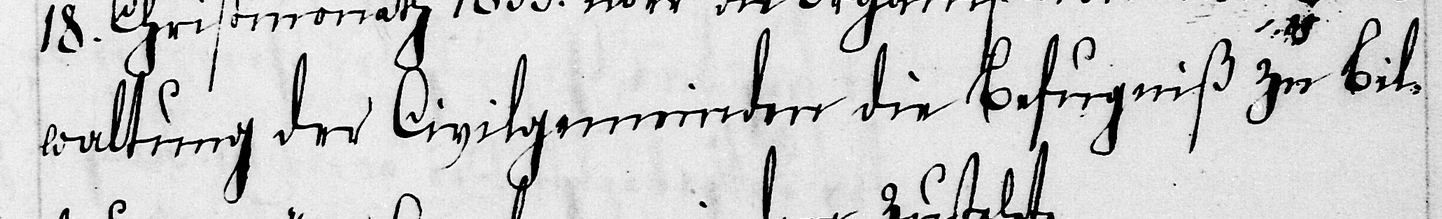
waltung der Civilgemeinden die Befugniß zu Bil¬
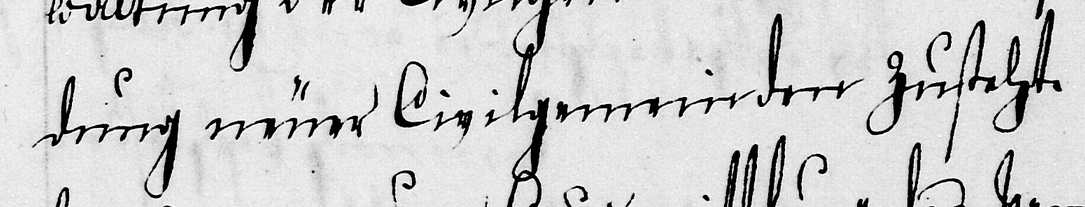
dung neuer Civilgemeinden zusteht.
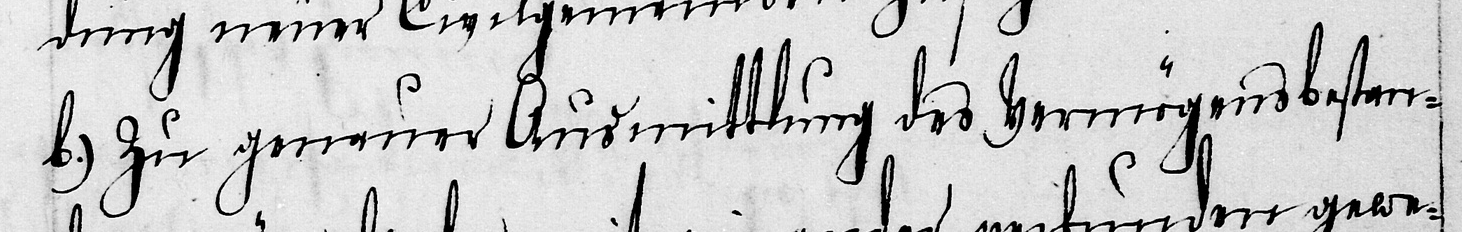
b.) Zu genauer Ausmittlung des Vermögensbestan¬
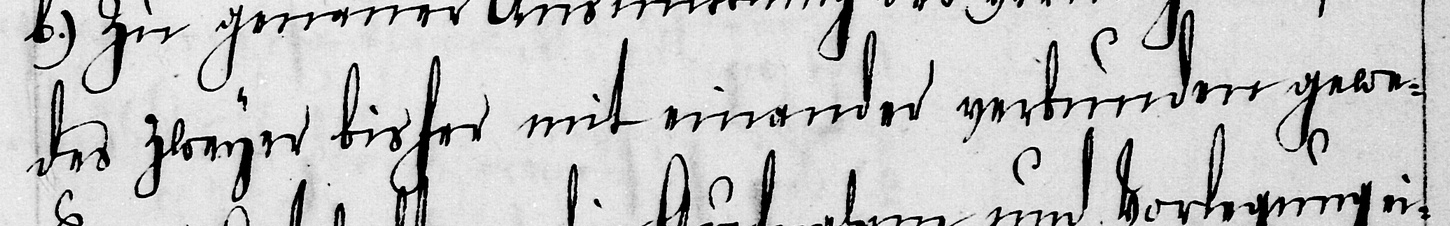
des zweyer bisher mit einander verbunden gewe¬
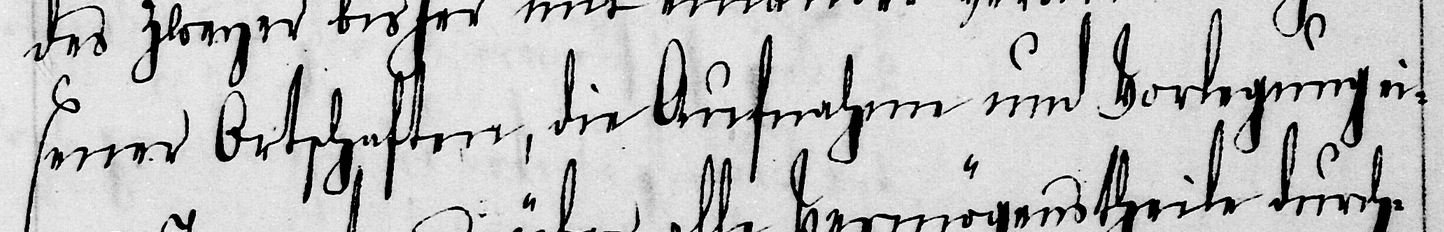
sener Ortschaften, die Aufnahme und Vorlegung e¬
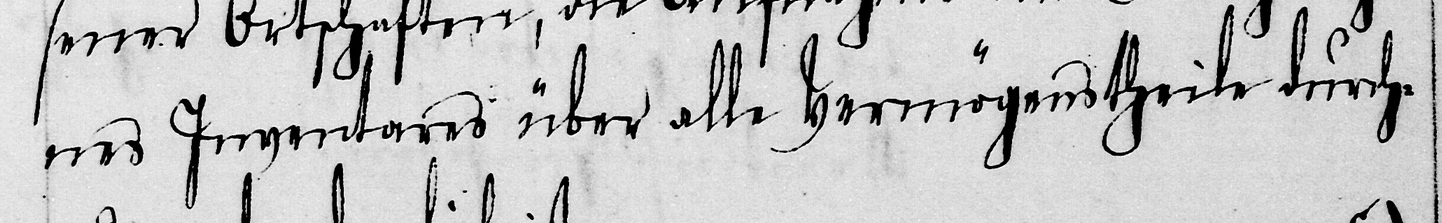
ines Inventares über alle Vermögenstheile durch¬
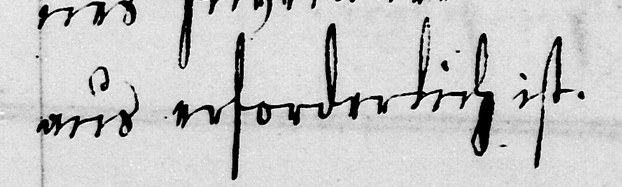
aus erforderlich ist.
